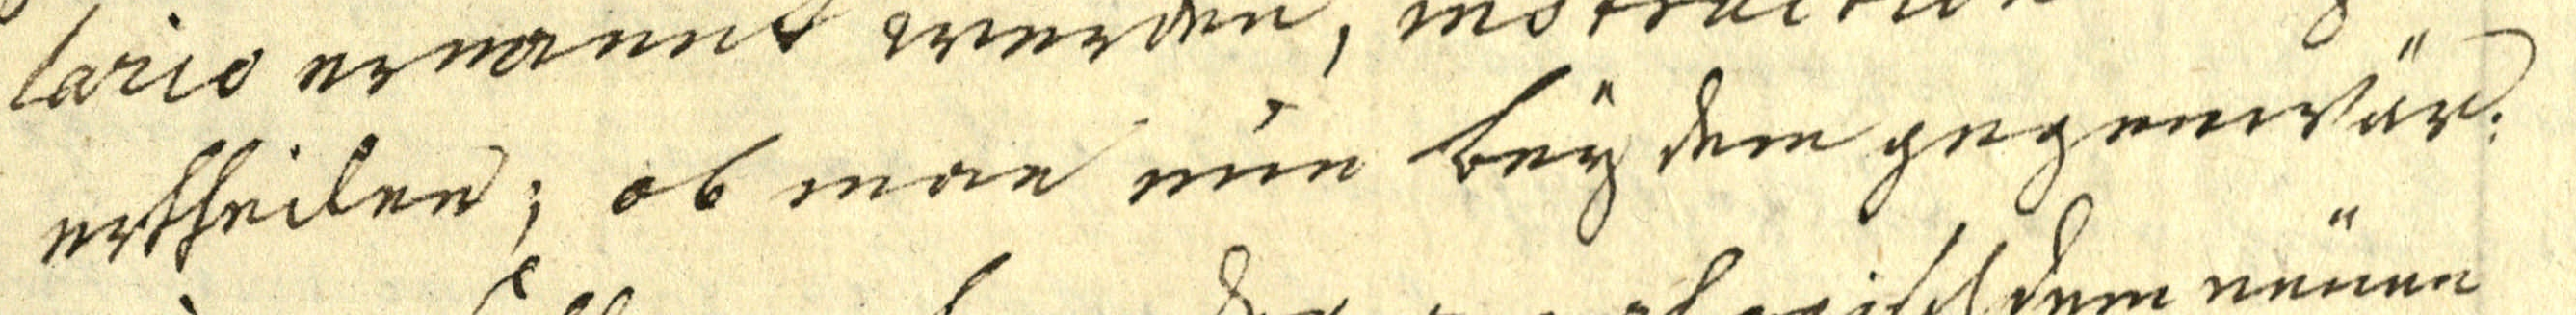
ertheilen, ob man nun beÿ dem gegenwär¬
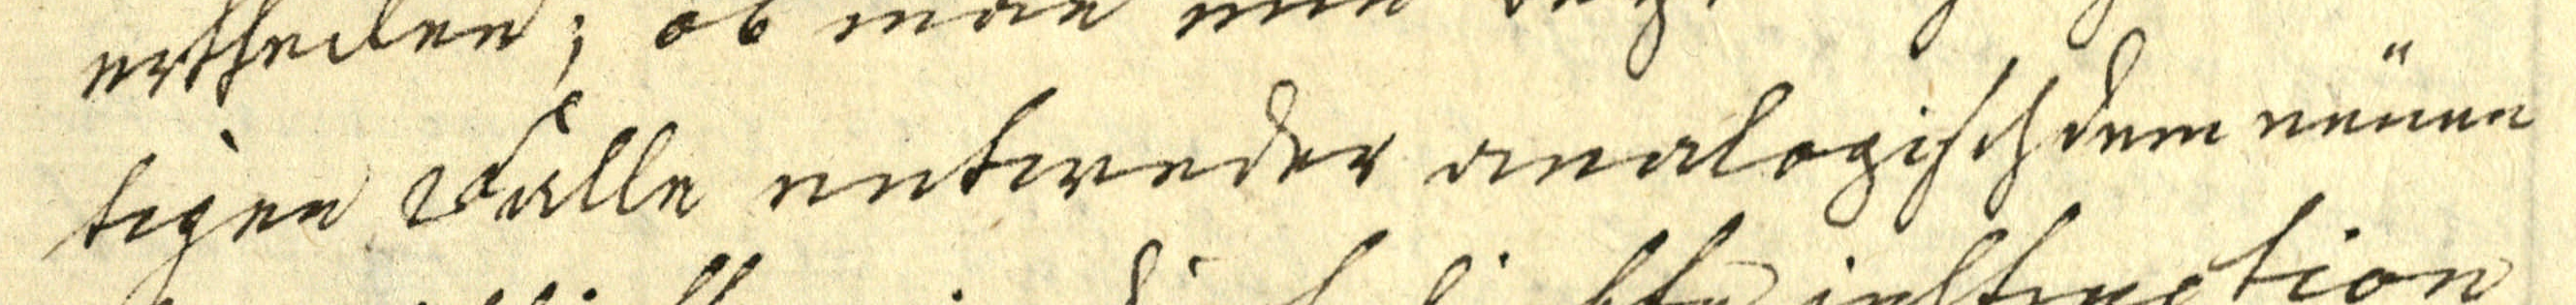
tigen Falle entweder analogisch dem neuen
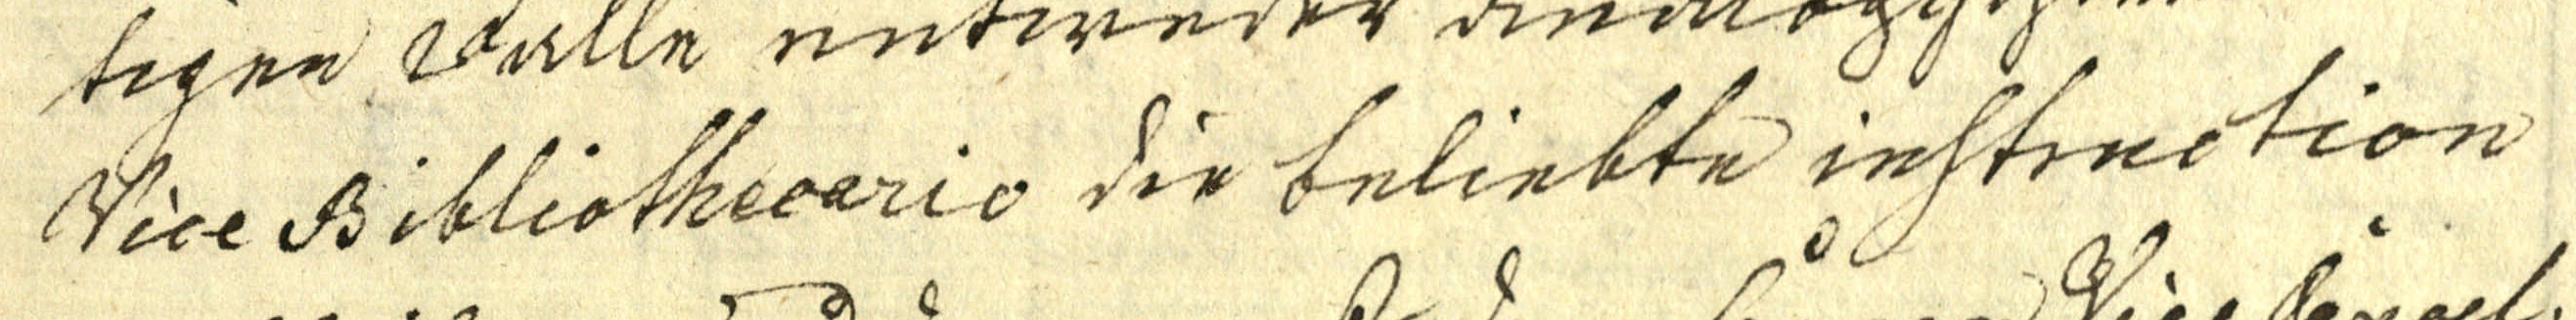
Vice Bibliothecario die beliebte instruction
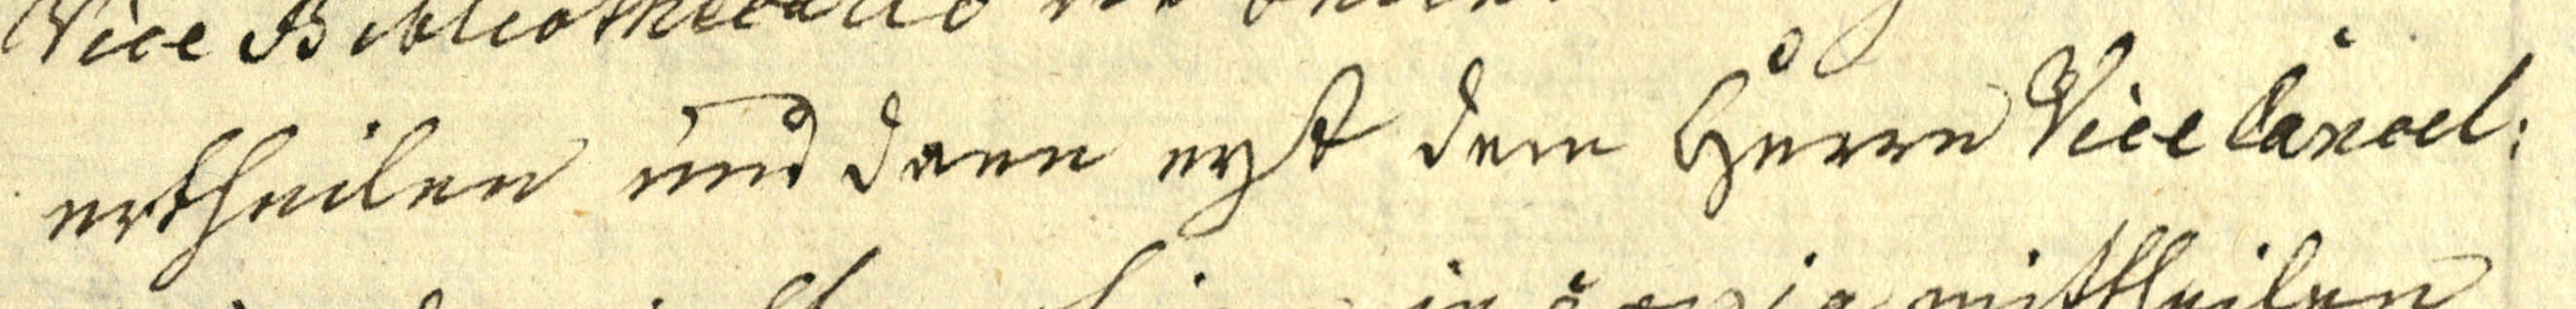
ertheilen und dann erst den Herrn ViceCancel¬
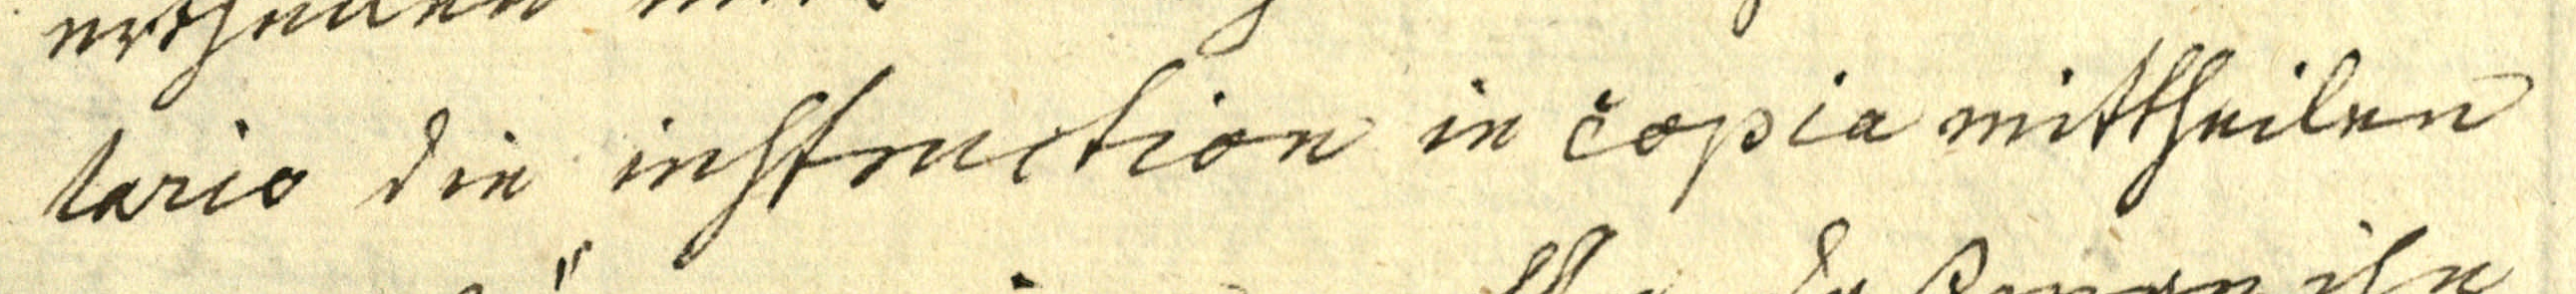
lario die instruction in copia mittheilen
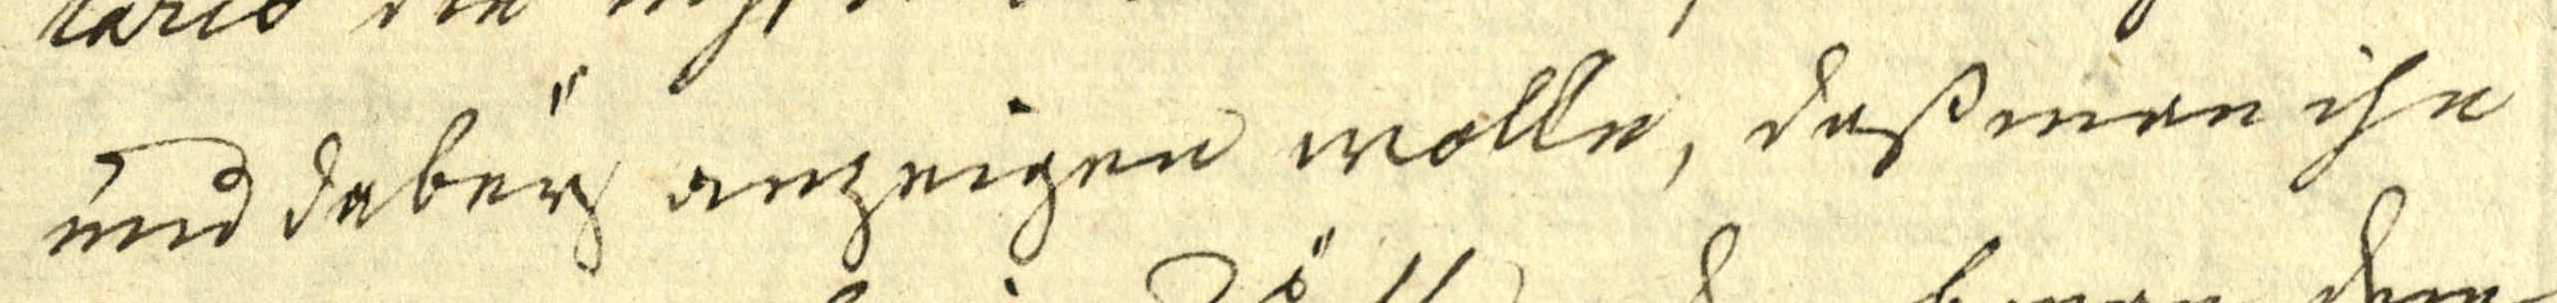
und dabeÿ anzeigen wolle, daß man ihn
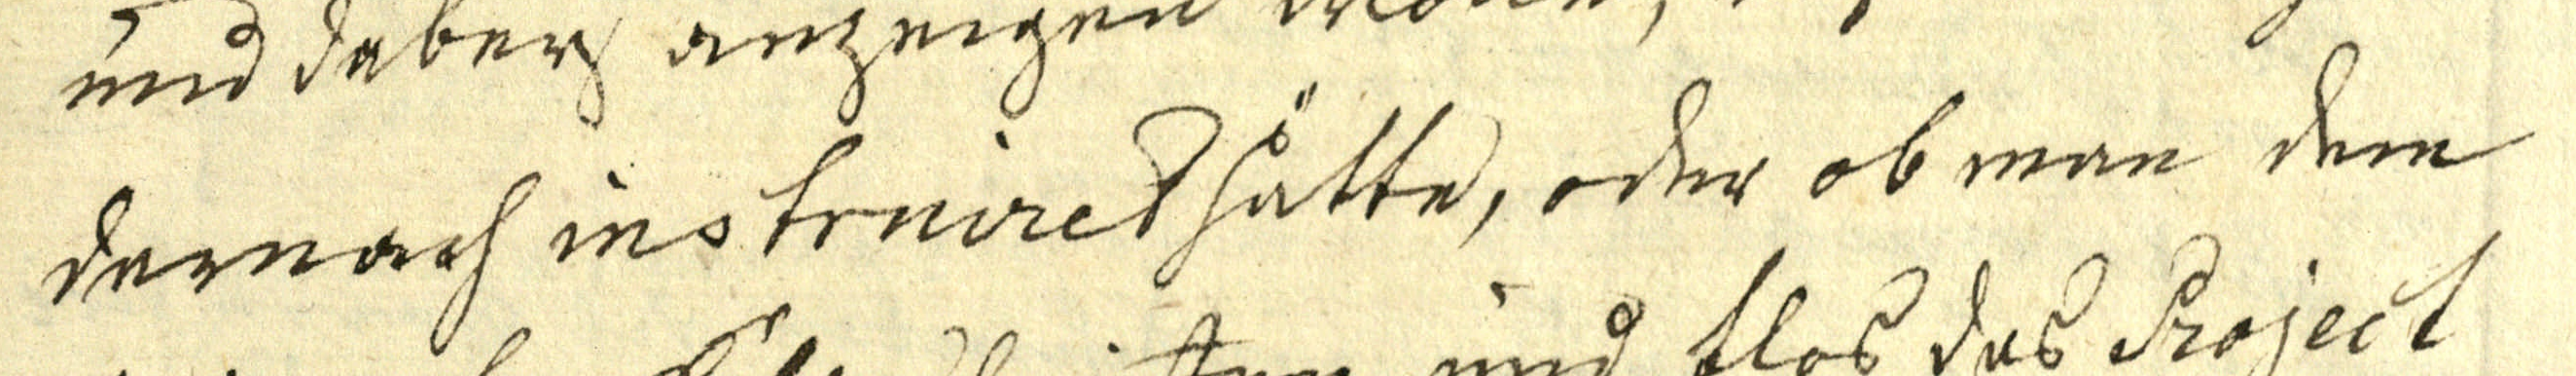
darnach instruiret hätte, oder ob man dem
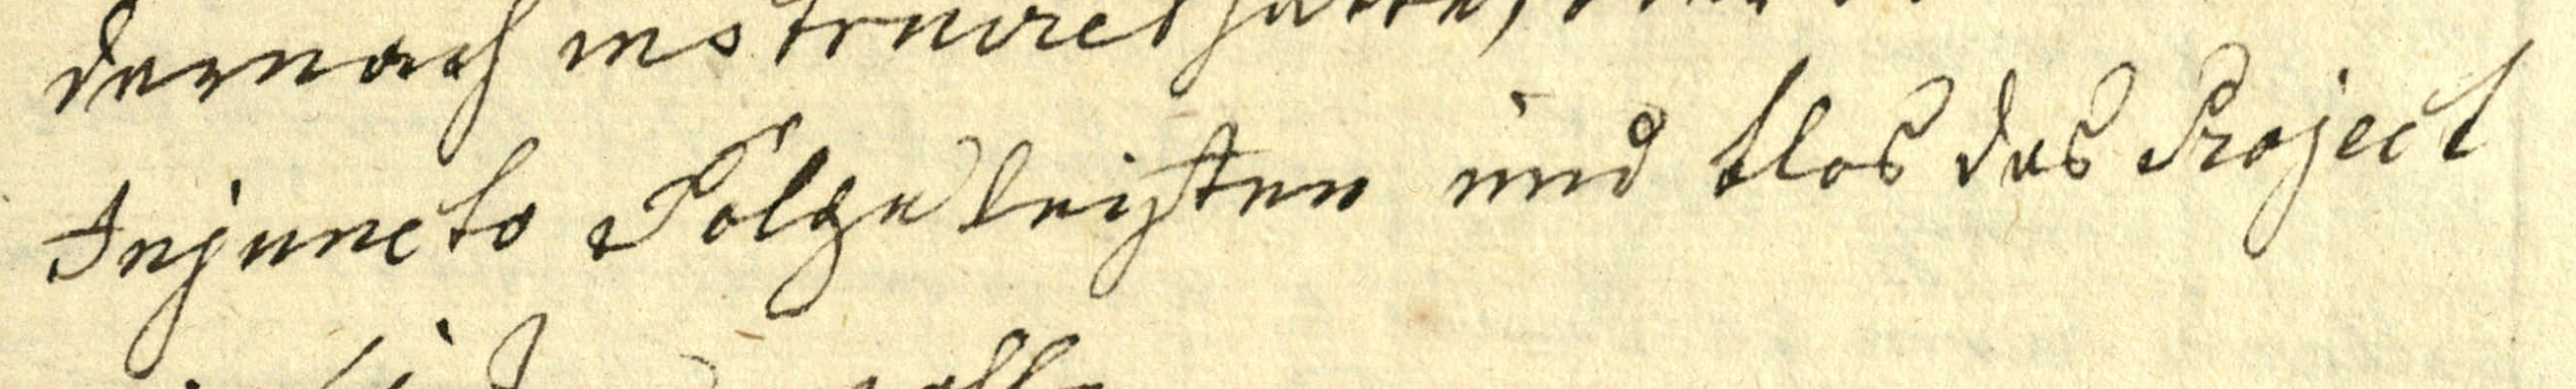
Injuncto Folge leisten und blos das Project
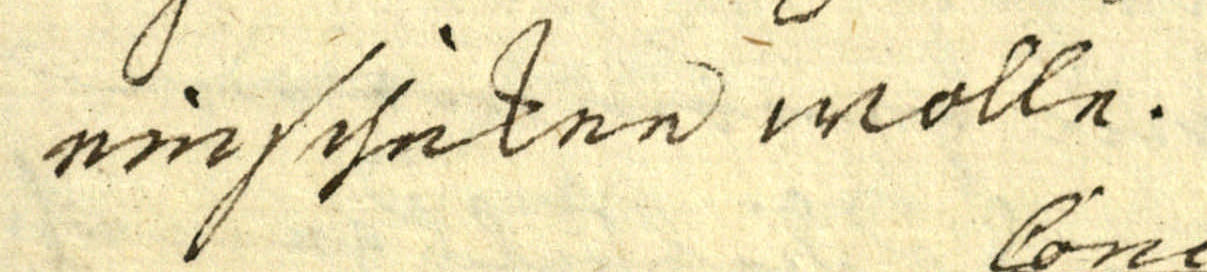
einschicken wolle.
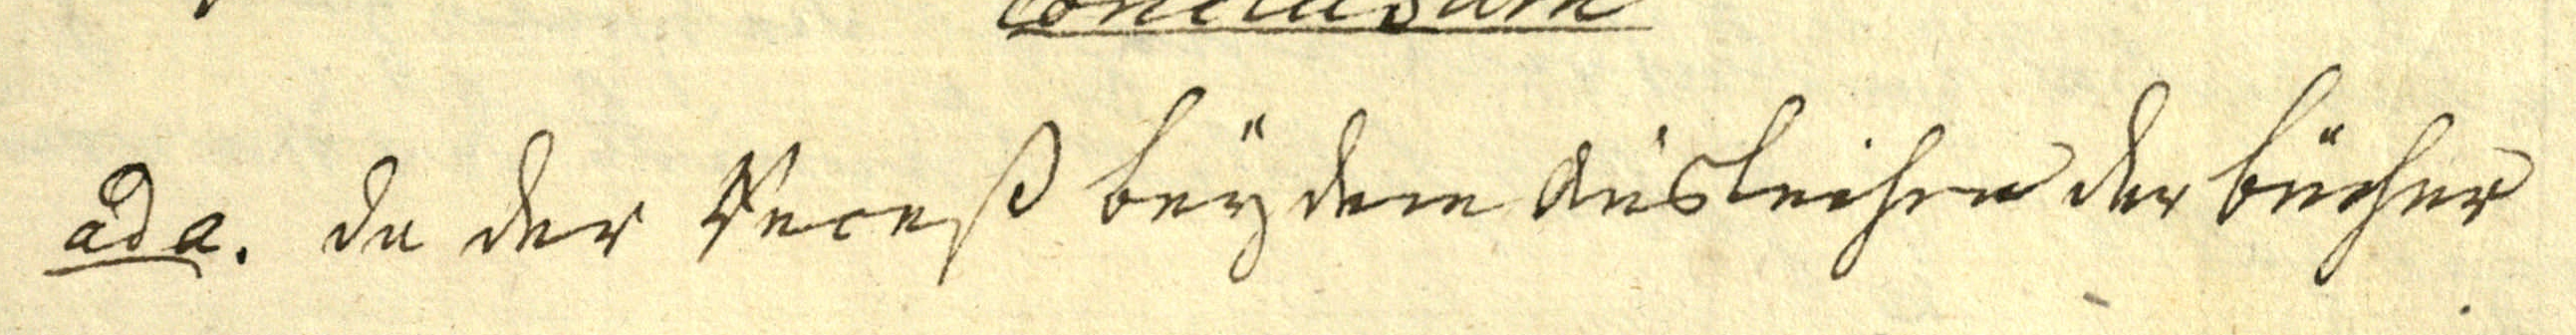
ad a. da der Receß beÿ dem Ausleihen der Bücher
